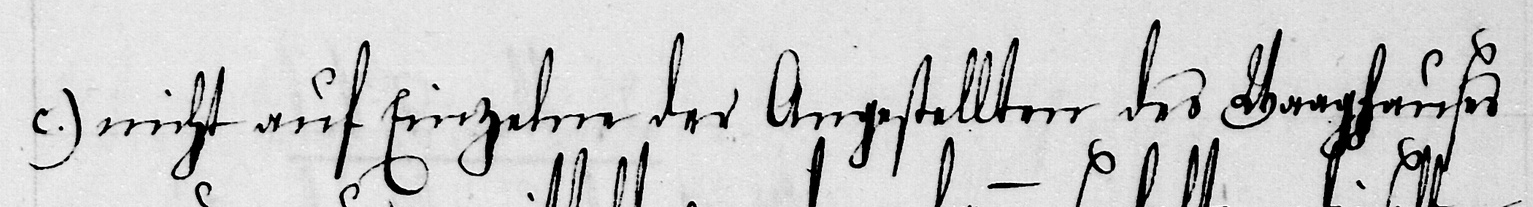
c.) nicht auf Einzelne der Angestellten des Waaghauses
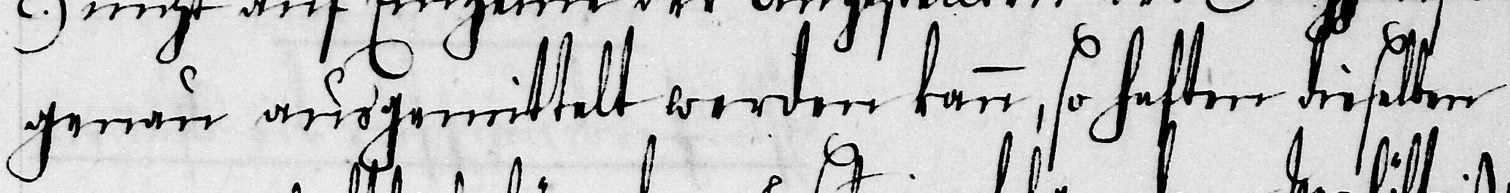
genau ausgemittelt werden kann, so haften dieselben
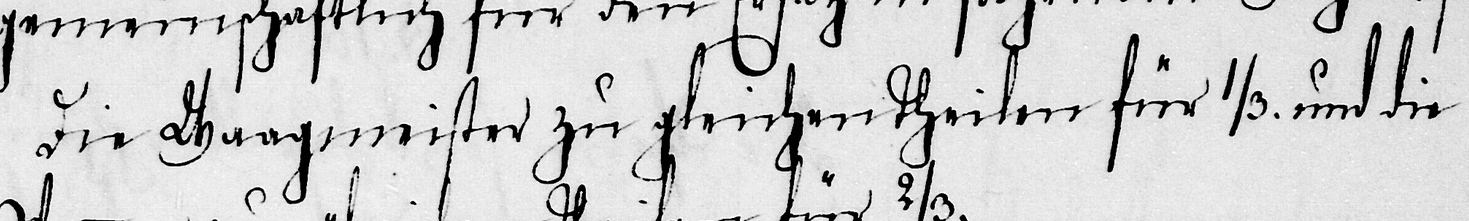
Die Waagmeister zu gleichen Theilen für 1/3. und die
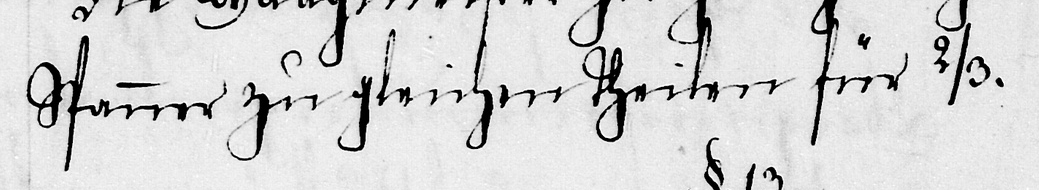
Spanner zu gleichen Theilen für 2/3.
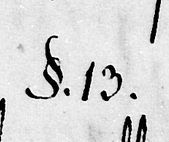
§. 13.
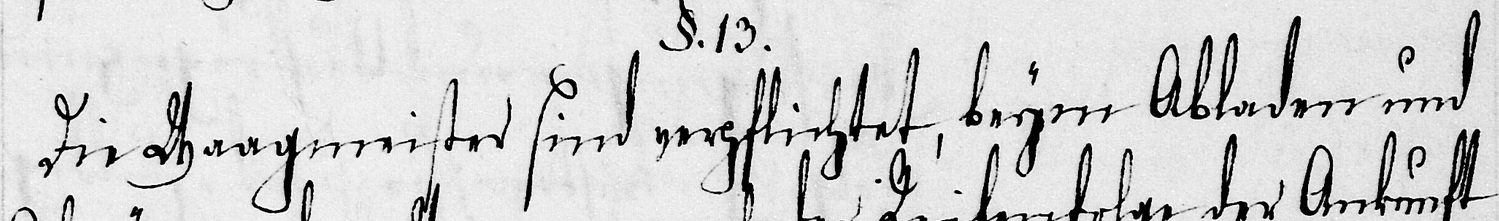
Die Waagmeister sind verpflichtet, beym Abladen und
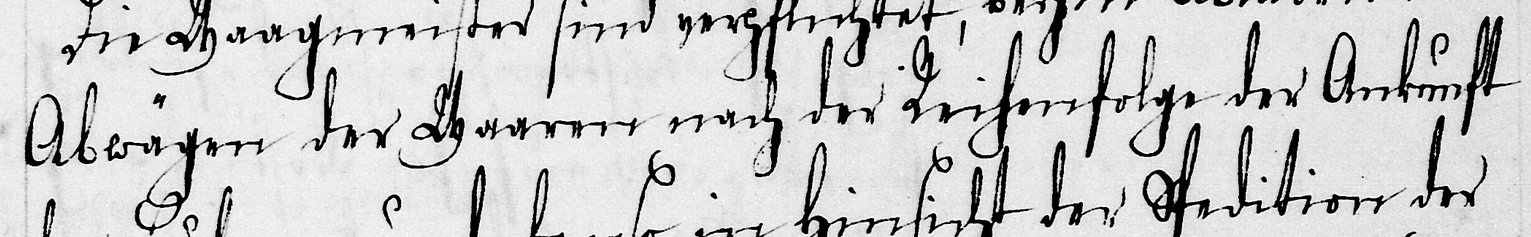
Abwägen der Waaren nach der Reihenfolge der Ankunft
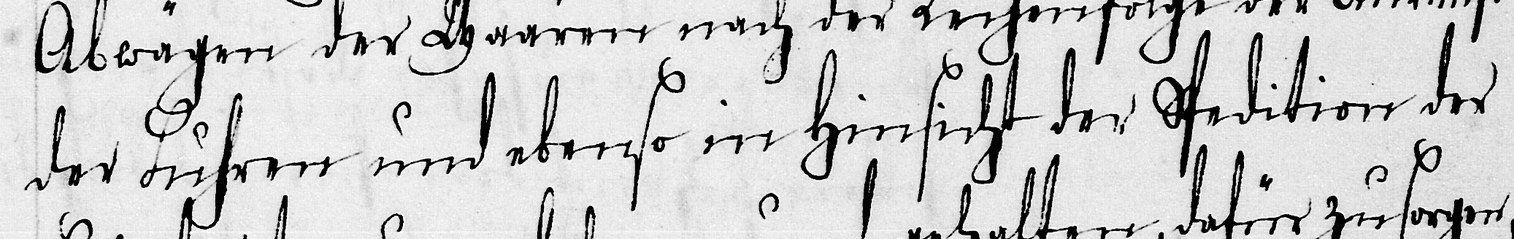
der Fuhren und ebenso in Hinsicht der Spedition der
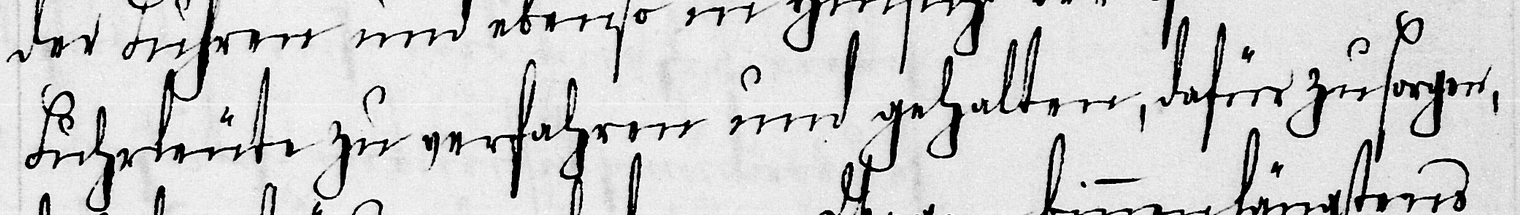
Fuhrleute zu verfahren und gehalten, dafür zu sorgen,
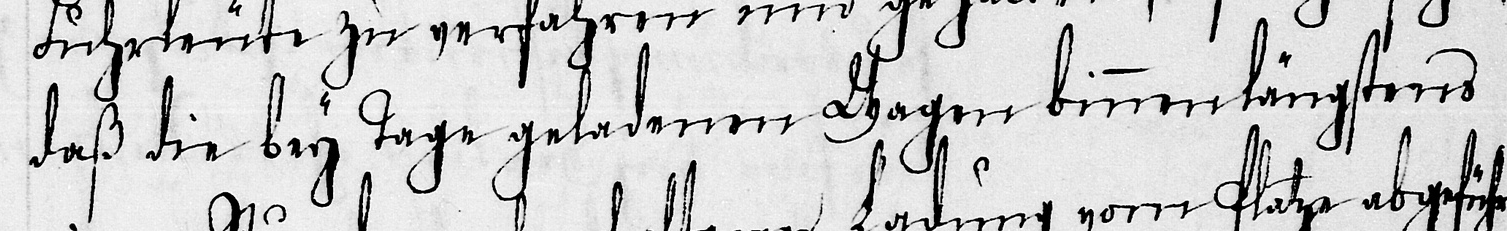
daß die bey Tage geladenen Wagen binnen längstens
